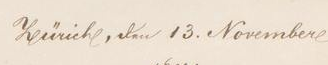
Zürich, den 13. November
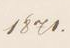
1871.
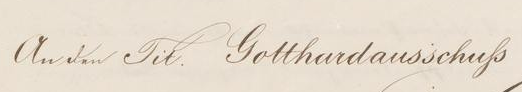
An den Tit. Gotthardausschuss
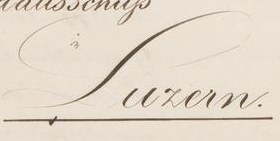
Luzern.
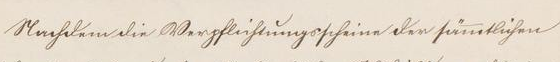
Nachdem die Verpflichtungsscheine der sämmtlichen
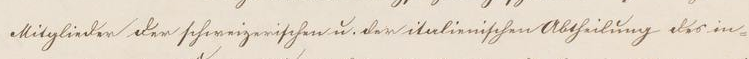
Mitglieder der schweizerischen u. der italienischen Abtheilung des in-
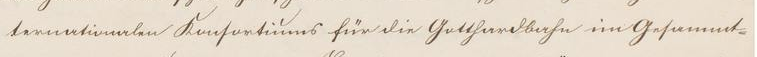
ternationalen Konsortiums für die Gotthardbahn im Gesammt-
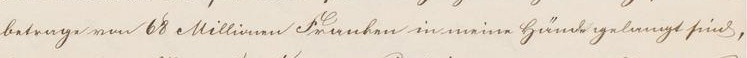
betrage von 68 Millionen Franken in meine Hände gelangt sind,
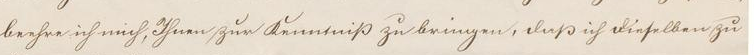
beehre ich mich, Ihnen zur Kenntniß zu bringen, daß ich dieselben zu
